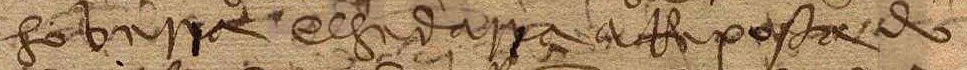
ho veria e lhe daria a Reposta do
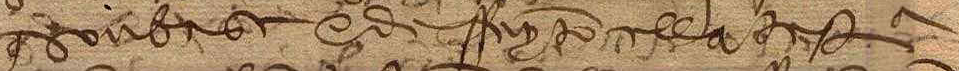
q̄ soubese e de ffeyto ella testa
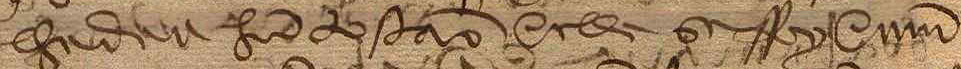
he deu hū tostão e elle se ffoy e nū
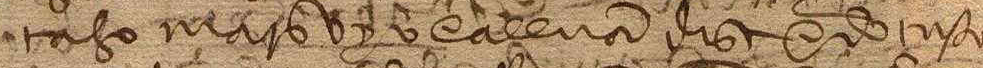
ca ho majs vyo e all nā dise e do custu
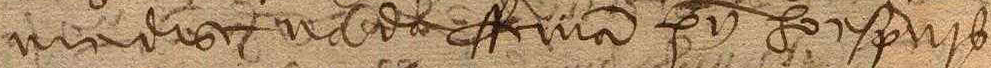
me dise nada ffernā p̄iz ho esp̄uj
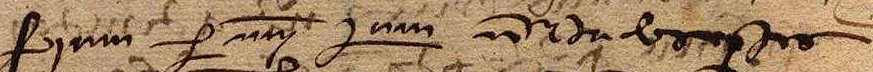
foram ꝑ m̄y tam cōcertados estes
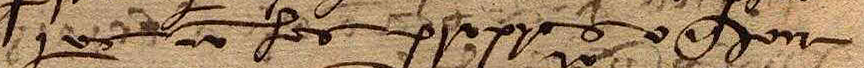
tos c̄o hos propyos o q̄ toca
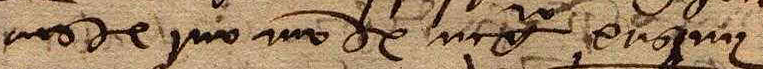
a este reo mōtenegro e asiney
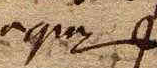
aquy
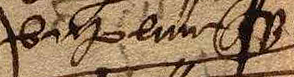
bertolameu fr̄z
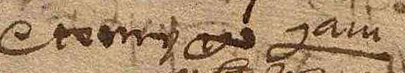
e comygo tam
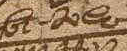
bertola
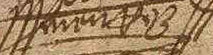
meu Roiz
